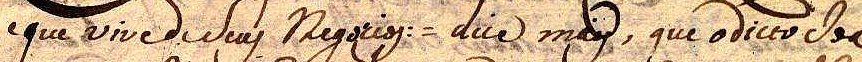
e que vive de seus Negocios:= dice mais, que o dicto Ioa
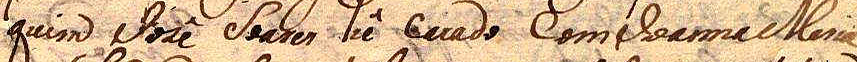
quim Iozé Soares hé Cazado Com Ioanna Maria
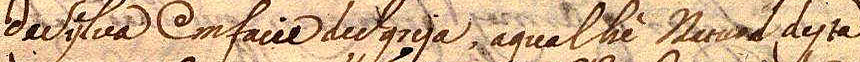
da Sylva em facie de Igreja, a qual hé Natural desta
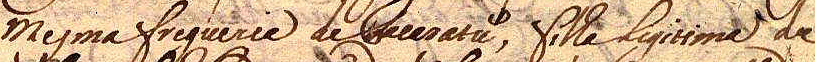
mesma freguezia de Tacaratú, filha Legitima de
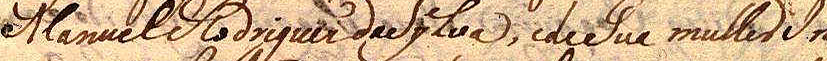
Manuel Rodriguez da Sylva, e de Sua mulher In
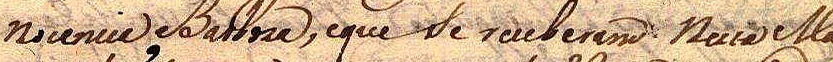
nocencia Barboza, e que Se receberam Nessa Ma
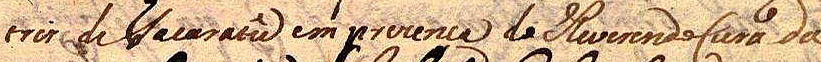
triz de Tacaratú em prezenca do Reverendo Cura da
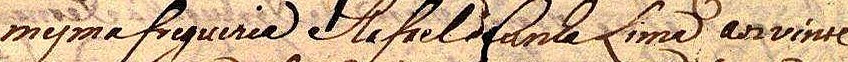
mesma freguezia Rafael Cunha Lima aoz vinte
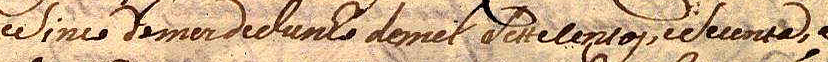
e Sinco do mez de Iunho de mil settecentos, e secenta, e
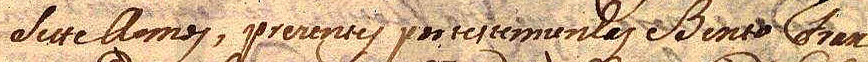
Sette annos, prezentes por testemunhas Bento Fran
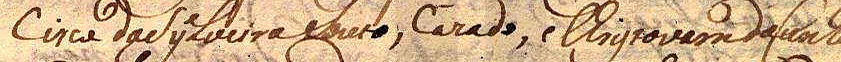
Cisco da SyLveira Souto, Cazado, e Christovam da Cunha
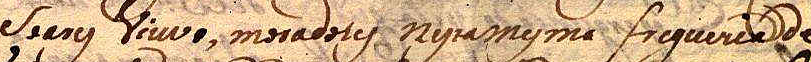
Soares Viuvo, moradores nesta mesma freguezia de
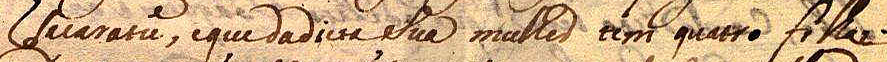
Tacaratú, e que da dicta Sua mulher tem quatro filhaz.
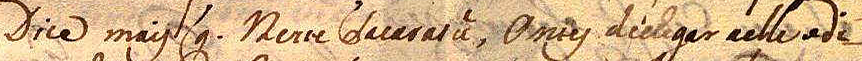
Dice mais q̄. Nezte Tacaaratú, antes de chegar a elle o di
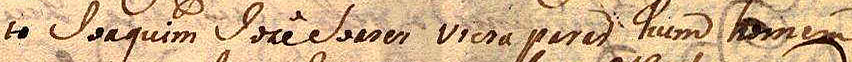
to Ioaquim Iozé Soares viera parar hum homem
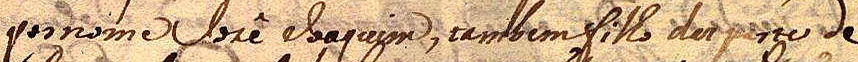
por nome Iozé Ioaquim, tambem filho daz parte de
